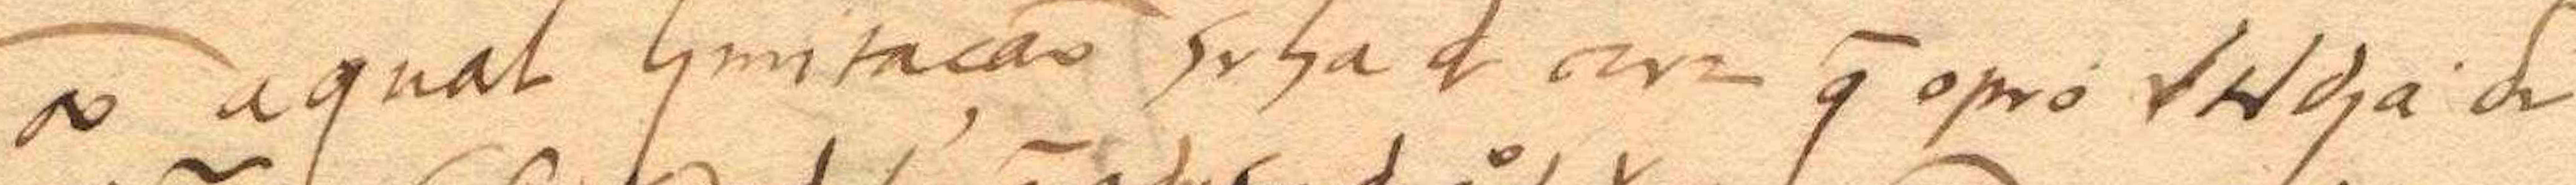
c̄o a qual ljmitação Se ha de crer q̄ o reo ētēdja de
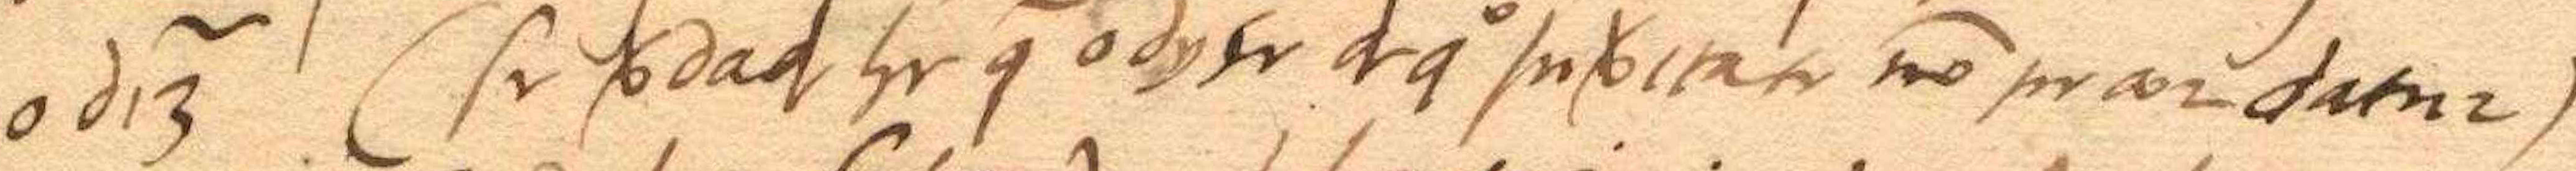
o diz̄ (se ꝟdade he q̄ o dyse de qo Jn ꝟitate n̄o recordatur)
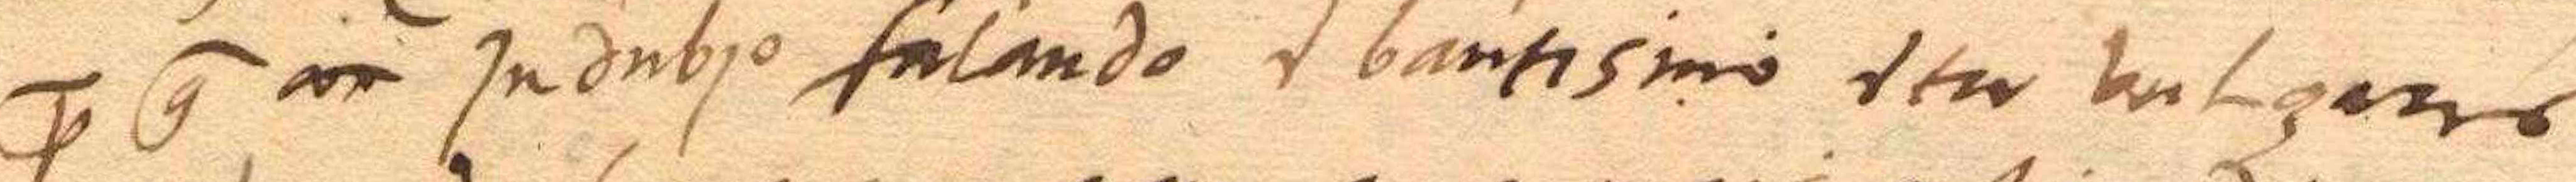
p̄ q̄ _ Jn dubjo falando ē bautismo ētre vulgares
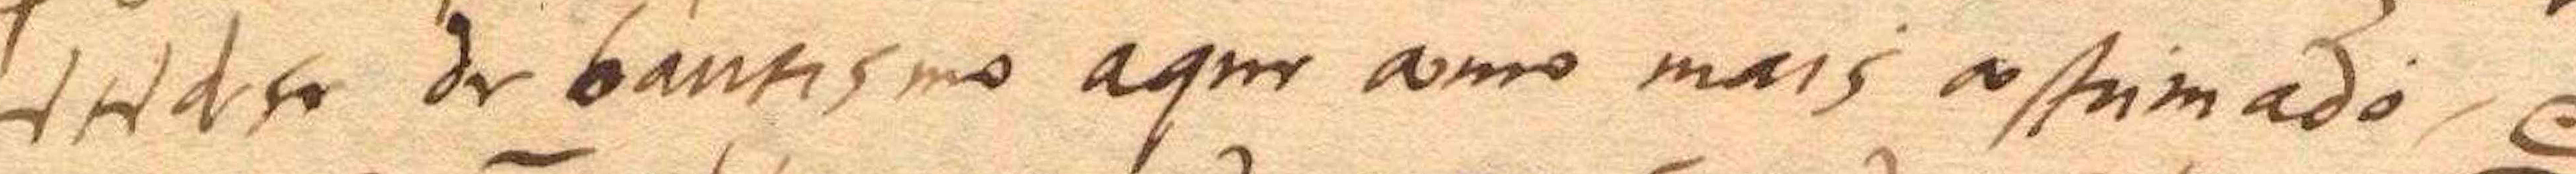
ētēdese de bautismo a que como mais costumado / e
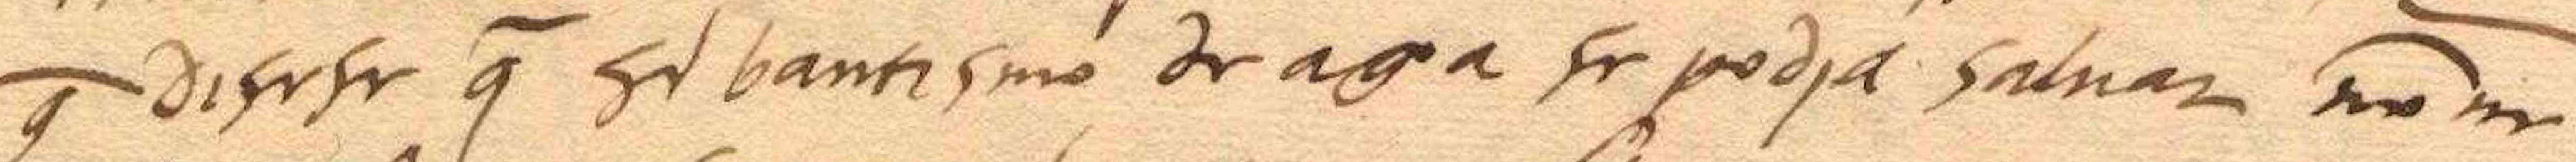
q̄ disese q̄ sē bautismo de agoa se podja saluar n̄o ne
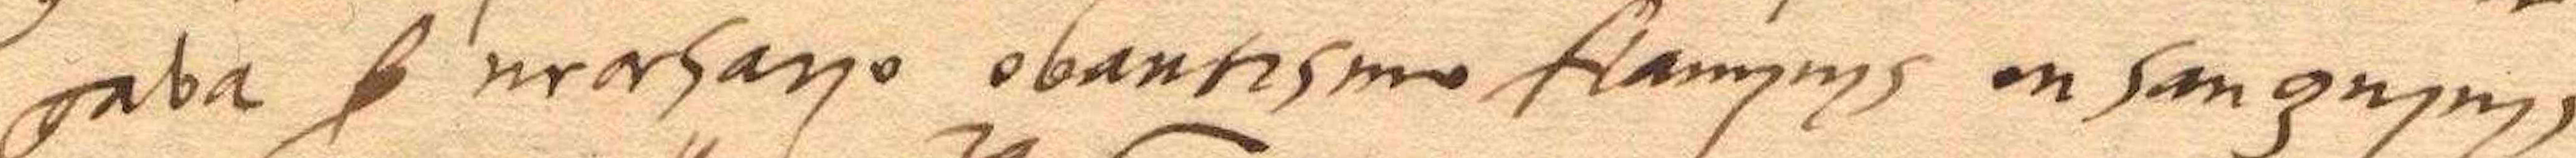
gava ꞩ neceSarjo o bautismo flamjnjs ou Sangujnjs
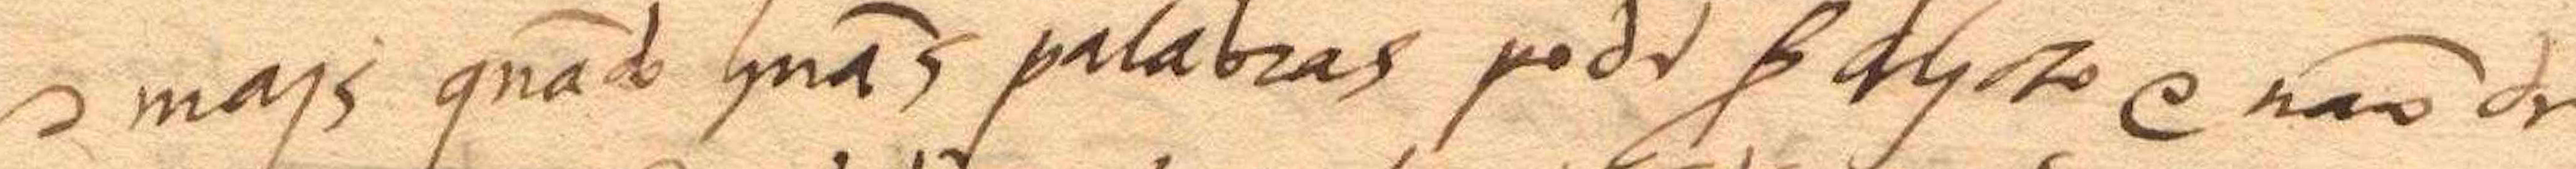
e majs quādo huās palavras podē ꞩ deljcto e não de
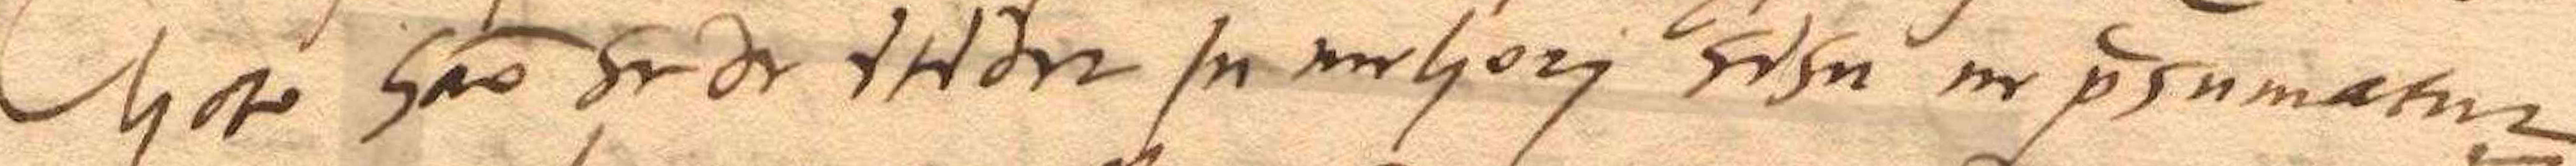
ljcto São se de ētēder Jn meljorj sēsu ne p̄sumatur
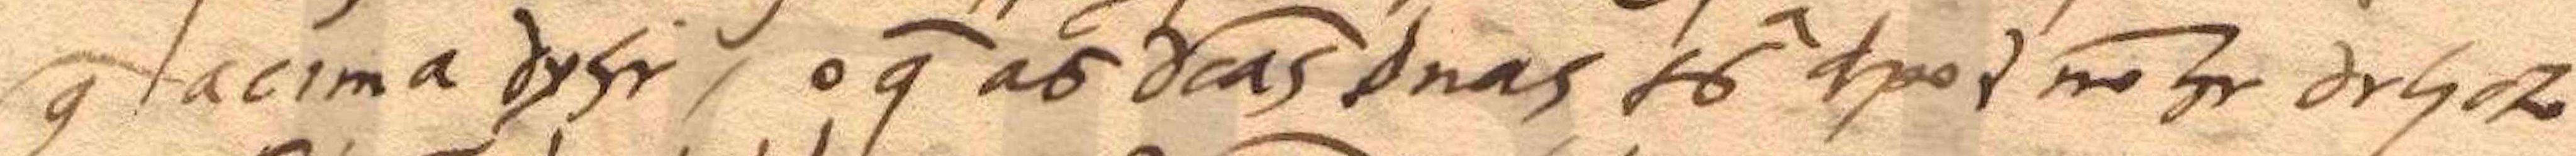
q̄ acima dyse / o q̄ as dc̄as duas tsa depoē nō he deljcto
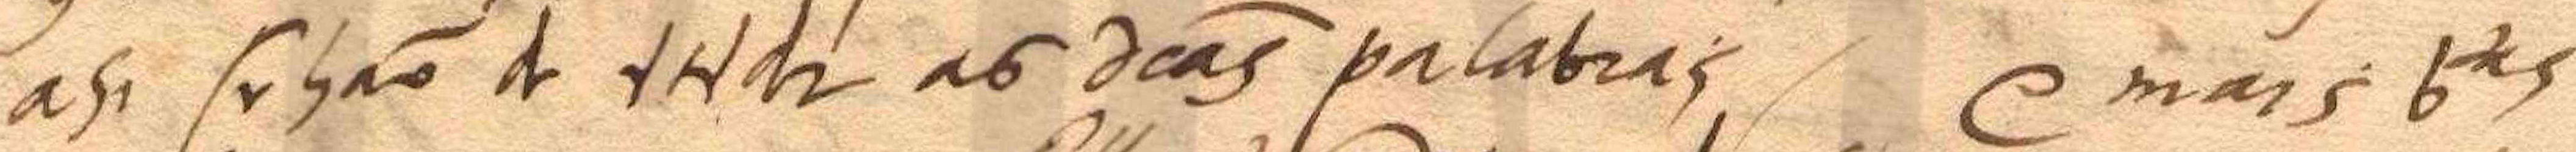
asi se hão de ētēder as dcās palavras / e mais vtas
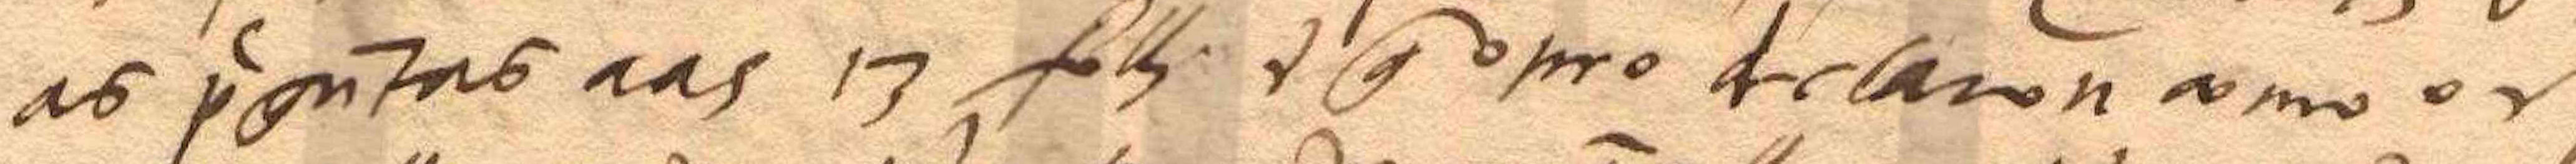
as p̄gūtas aas 13 folh ē q̄ o reo declarou como o ē
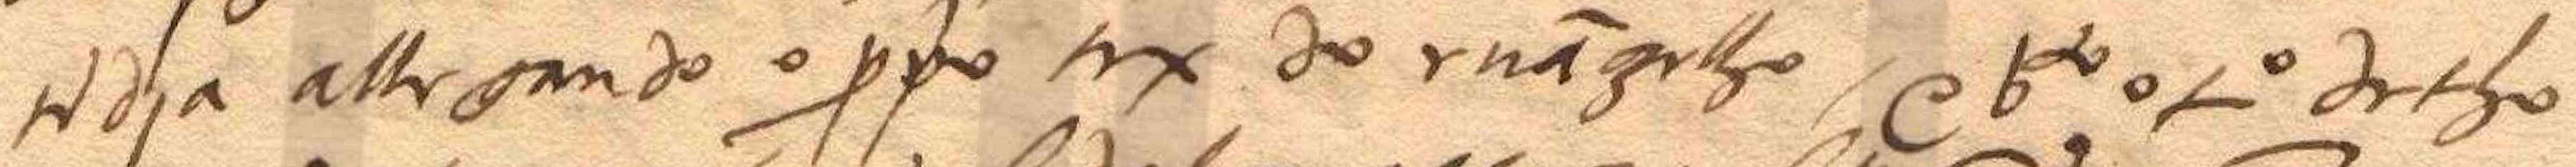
tēdja allegando o ꝓpio tex do euāgelho / e vto o to de tho
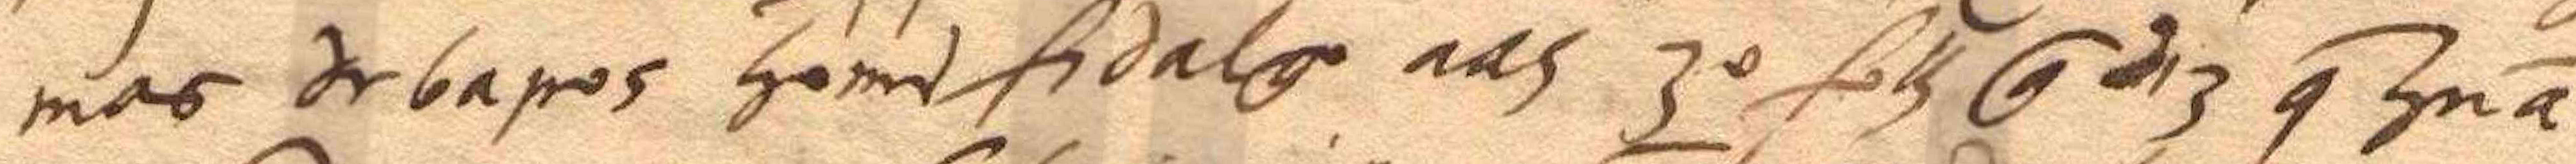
mas de baros homē fidalgo aas 30 folh q̄ diz q̄ huā
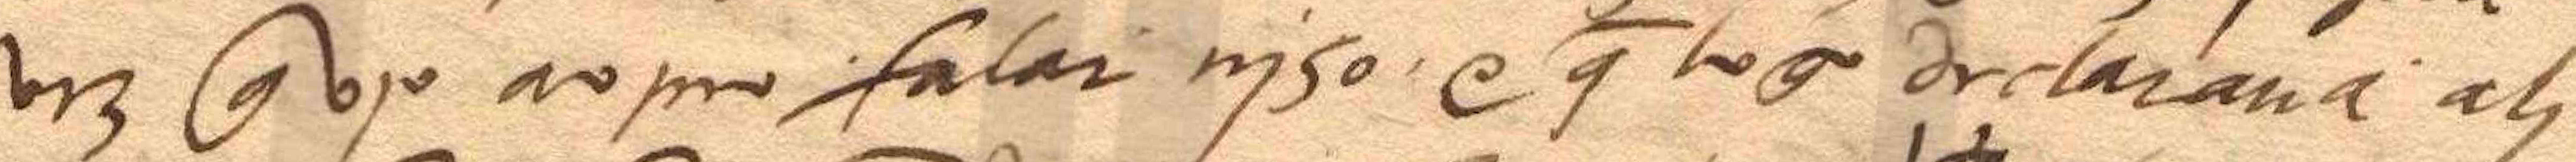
vez q̄ vjo ao reo falar njso. e q̄ logo declaraua alj
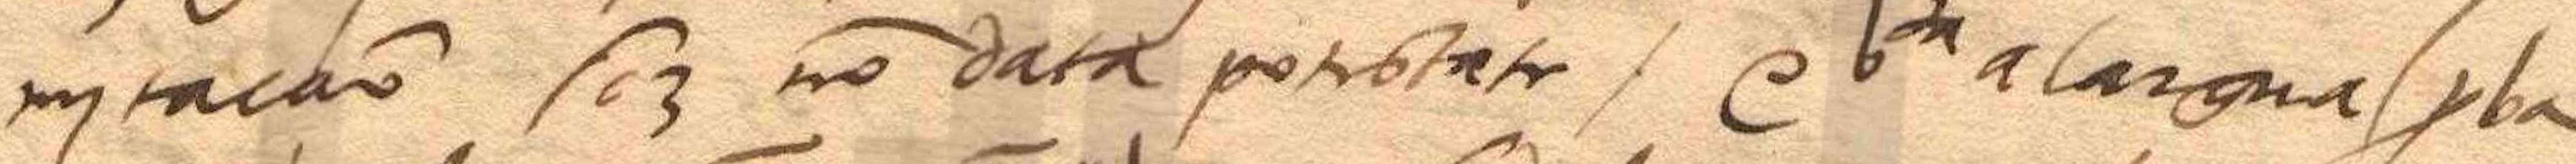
mjtação scz nō data potestate / e vta a largua ꝓva
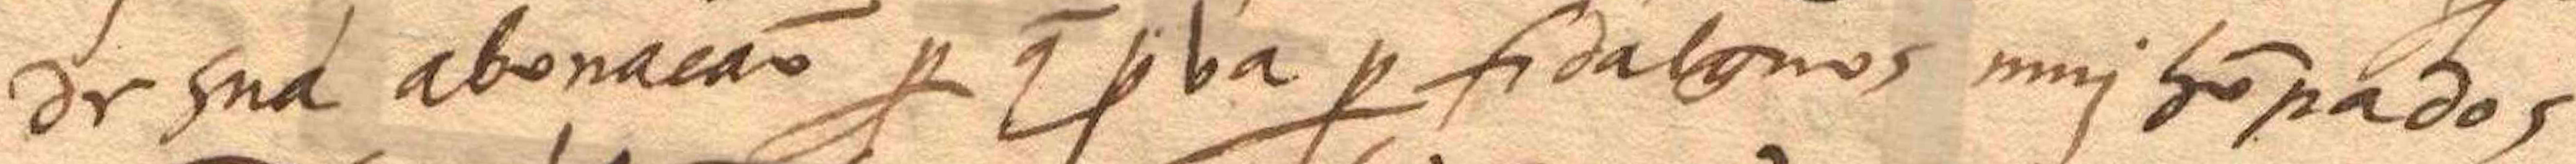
de sua abonação ꝑ q̄ ꝓva ꝑ fidalguos muj hōrados
